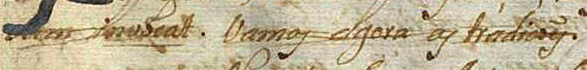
sam inuocat. Vamos agora as tradiçoẽs.
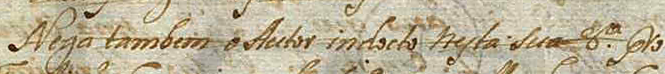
Nega tambem o Autor indocto nesta sua 8.a pRo
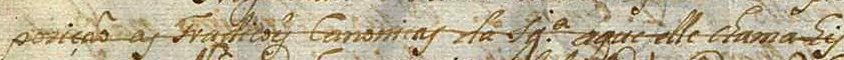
poziçaõ as Tradicoẽs Canonicas da Ig.a a que elle chama his
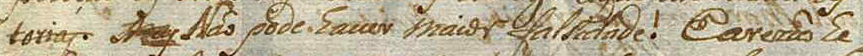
torias. Mas Não pode hauer maior falsidade! E a rezaõ he
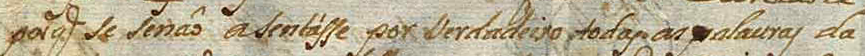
porq̄ se senaõ asentásse por verdadeiro todas as palauras da
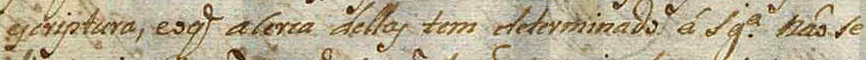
escriptura, e o q̄ aCerca dellas tem determinado á Ig.a não se
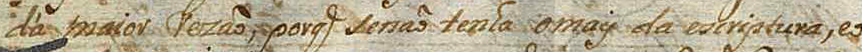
dá maior Rezaõ, porq̄ senaõ tenha o mais da escriptura, e o
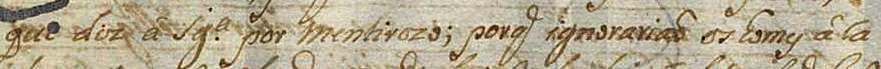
que diz a Ig.a por mentirozo; porq̄ ignorariaõ os homes á Ca
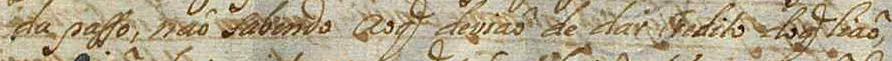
da passo, naõ sabendo ao q̄ deviaõ de dar Credito do q̄ liaõ,
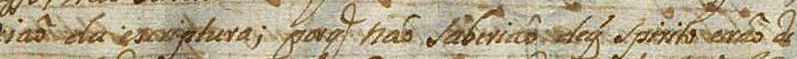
iaõ da escriptura; porq̄ naõ saberiaõ de q̄ spirito eraõ di
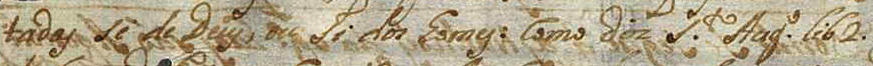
tadas se de Deus, ou si dos homes: Como diz S.to Aug.o lib 2.
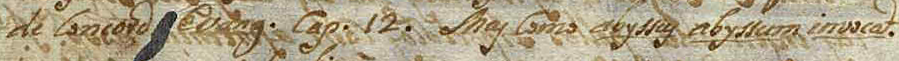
de Concord_ Evang. Cap. 12. Mas Como abyssus abyssam invocat.
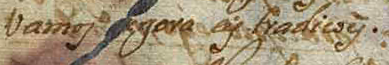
vamos _gora as tradicoẽs.
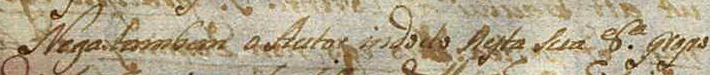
Nega tambem o Autor indocto nesta sua 8.a propo
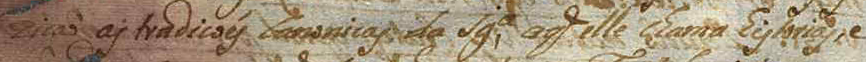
ziçaõ as tradicoẽs Canonicas da Iga, a q̄ elle chama historias, e
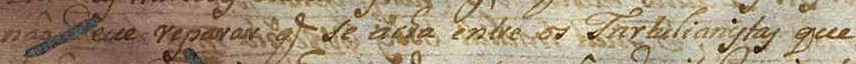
naõ _eue reparar q̄ se acha entre os Tartulianistas que
